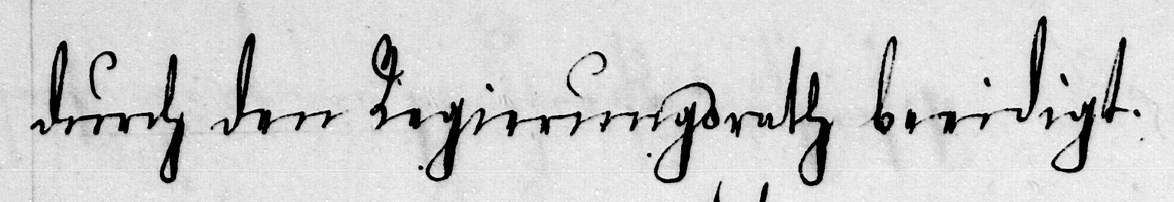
durch den Regierungsrath beeidigt.
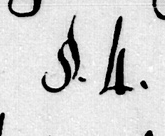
§. 4.
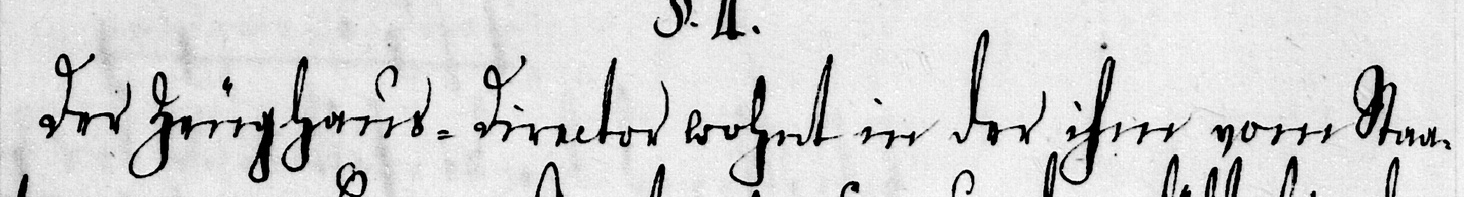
Der Zeughaus-Director wohnt in der ihm vom Sta¬
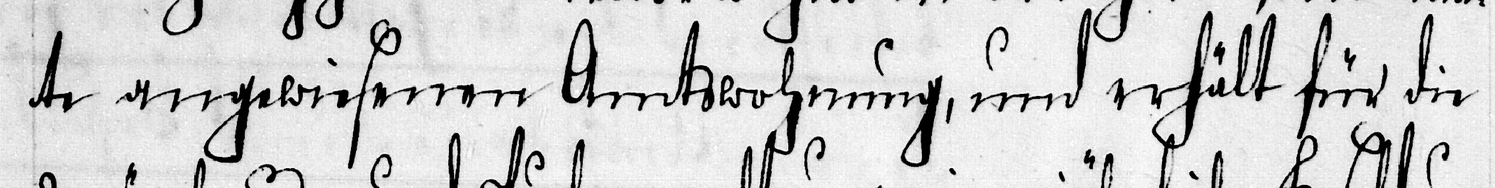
ate angewiesenen Amtswohnung, und erhält für die
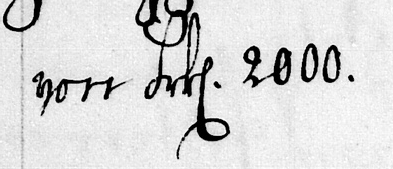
von Frk[en]. 2000.
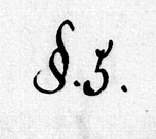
§. 5.
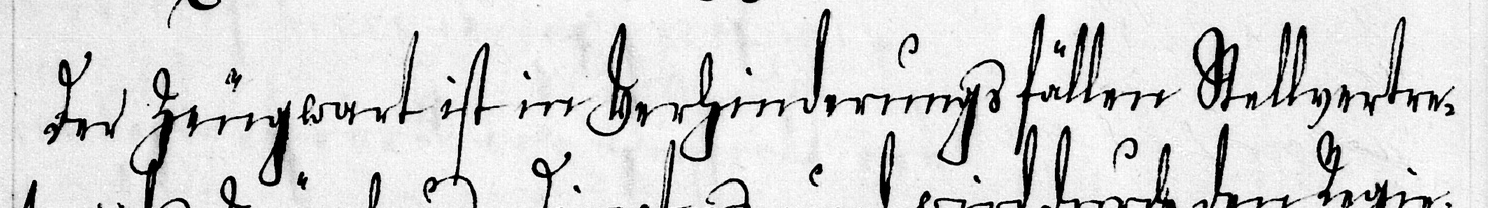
Der Zeugwart ist in Verhinderungsfällen Stellvertre¬
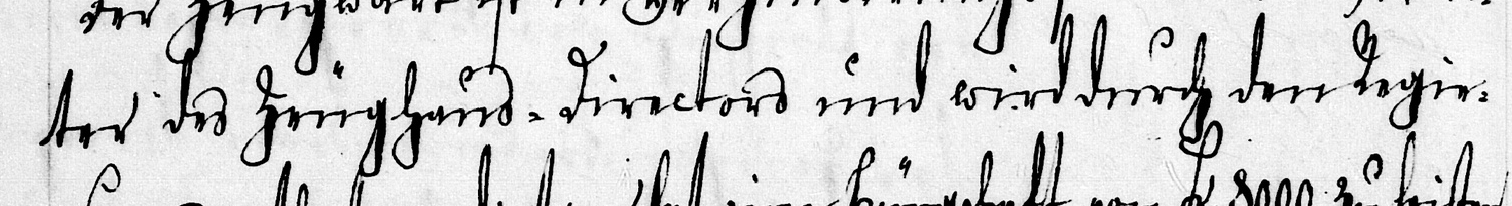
ter des Zeughaus-Directors und wird durch den Regie¬
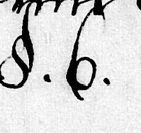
§. 6.
